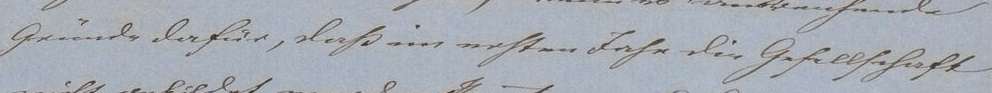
Gründe dafür, daß im ersten Jahr die Gesellschaft
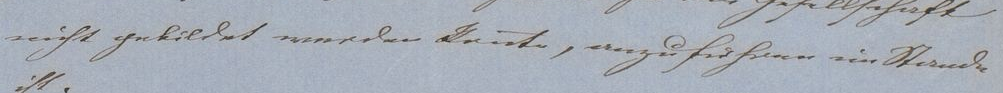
nicht gebeildet werden konnte, anzuführen im Stande
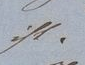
ist.
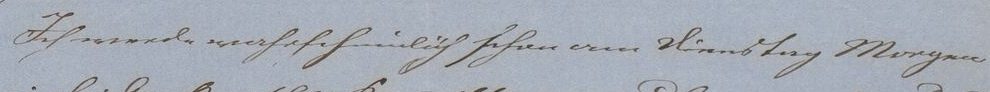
Ich werde wahrscheinlich schon am Dienstag Morgen
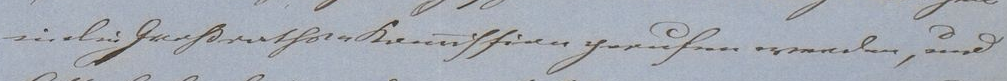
in die Großraths-Kommission gerufen werden, und
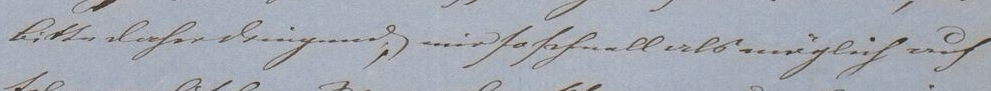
bitte daher dringend, mir so schnell als möglich auf
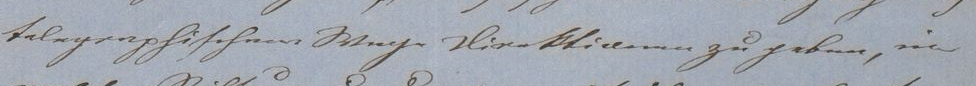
telegraphischem Wege Direktionen zu geben, in
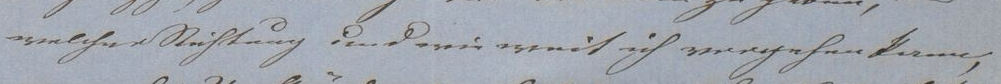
welcher Richtung und wie weit ich vorgehen kann,
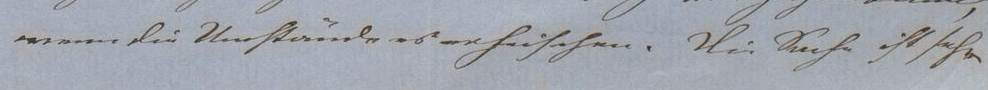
wenn die Umstände es erheischen. Die Sache ist sehr
